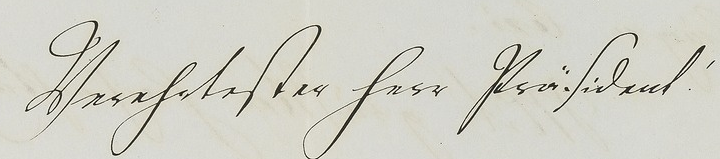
Verehrtester Herr Präsident!
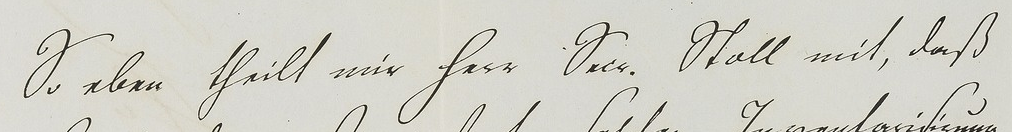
So eben theilt mir Herr Secr. Stoll mit, daß
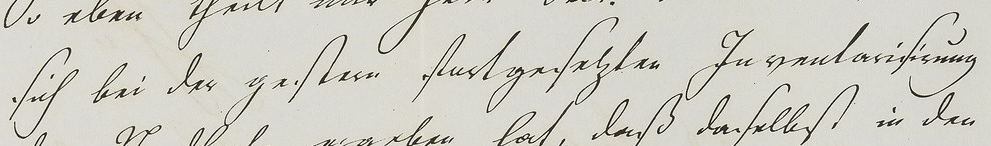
sich bei der gestern fortgesetzten Inventarisirung
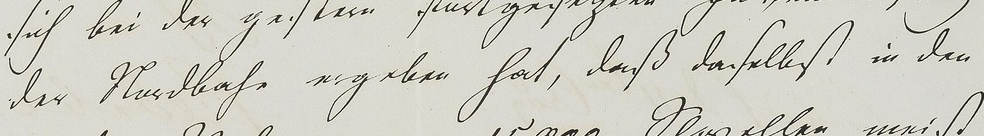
der Nordbahn ergeben hat, daß daselbst in den
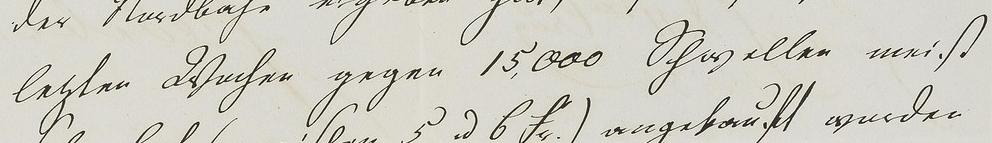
letzten Wochen gegen 15,000 Schwellen meist
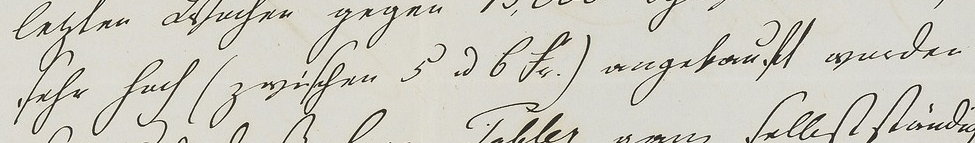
sehr hoch (zwischen 5 u 6 Fr.) angekauft worden
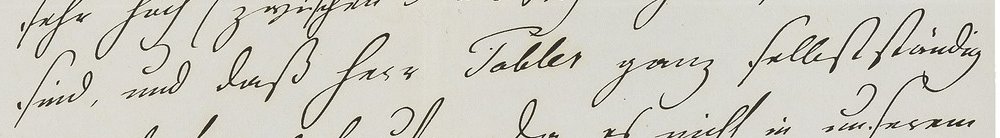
sind, und daß Herr Tobler ganz selbstständig
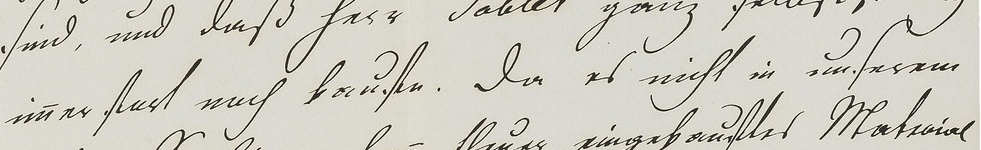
immerfort noch kaufe. Da es nicht in unserem
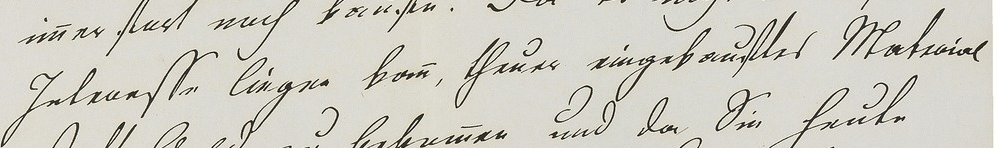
Interesse liegen kann, theuer eingekauftes Material
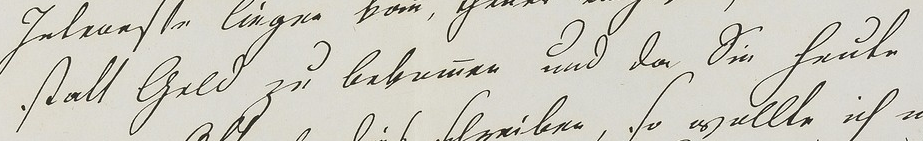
statt Geld zu bekommen und da Sie heute
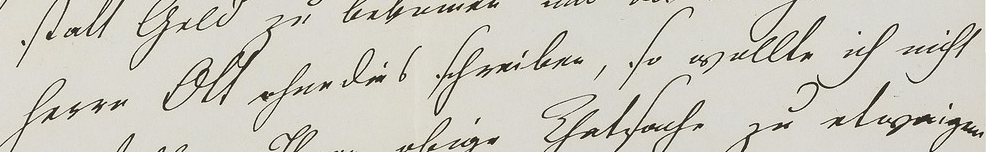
Herrn Ott ohnedies schreiben, so wollte ich nicht
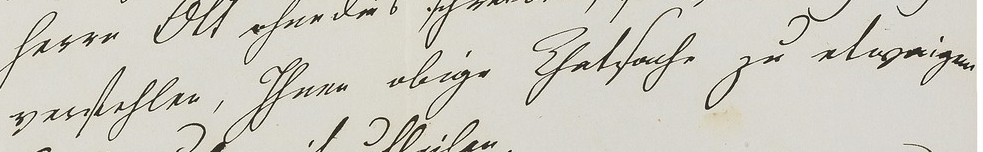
verfehlen, Ihnen obige Thatsache zu etwaigem
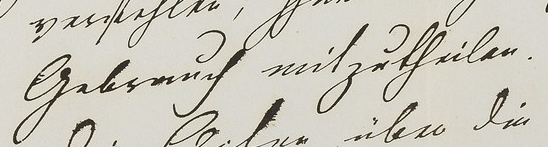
Gebrauch mitzutheilen.
